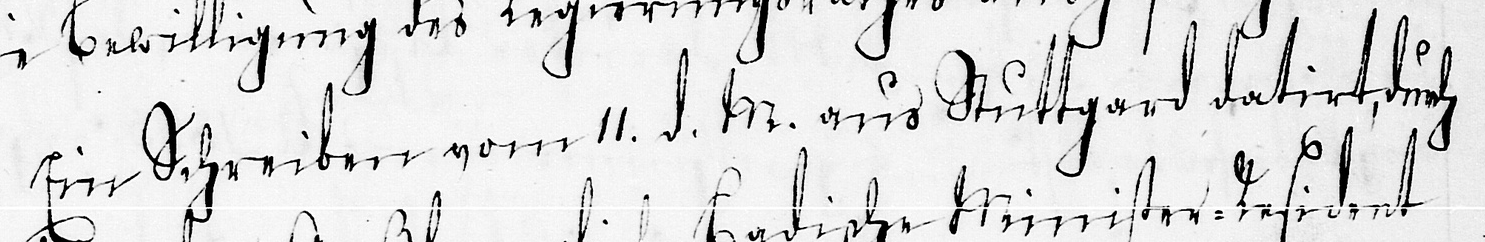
Ein Schreiben vom 11. d. M. aus Stuttgard datirt, durch
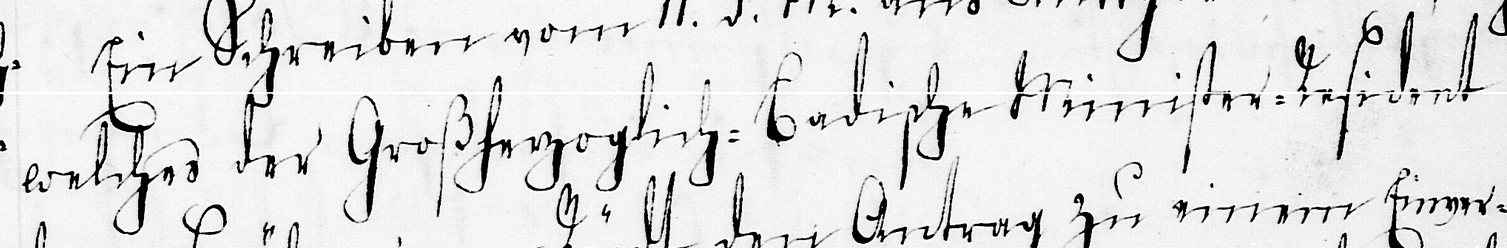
welches der Großherzoglich-Badische Minister-Resident
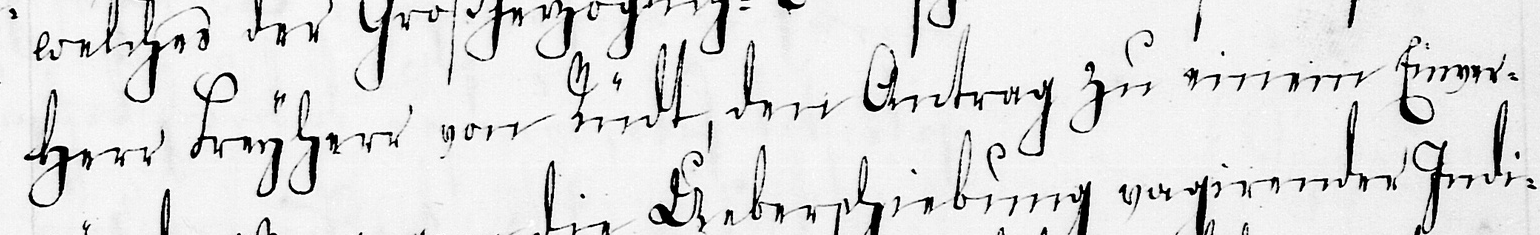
Herr Freyherr von Rüdt, den Antrag zu einem Einver¬
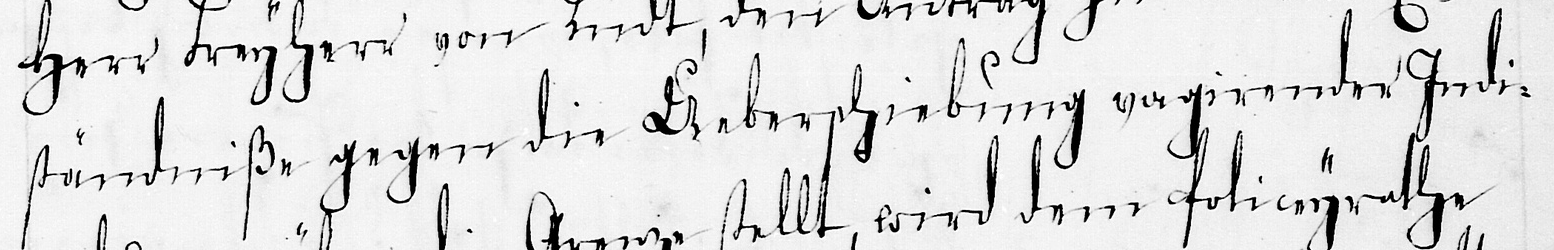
ständniße gegen die Ueberschiebung vagirender Indi¬
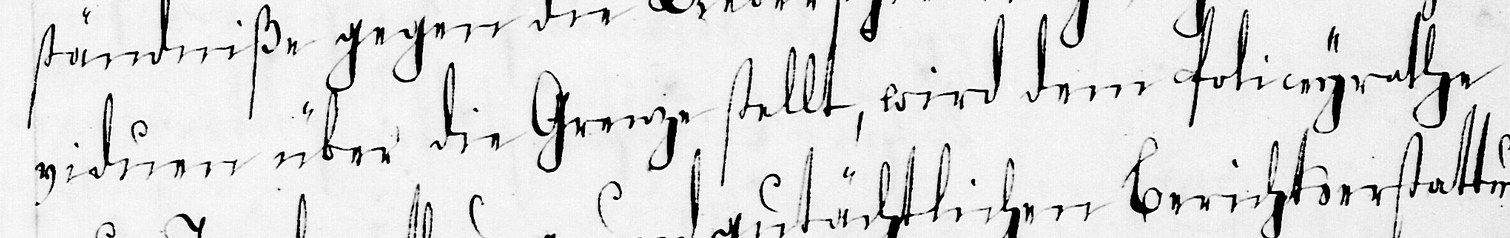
viduen über die Grenze stellt, wird dem Policeyrathe
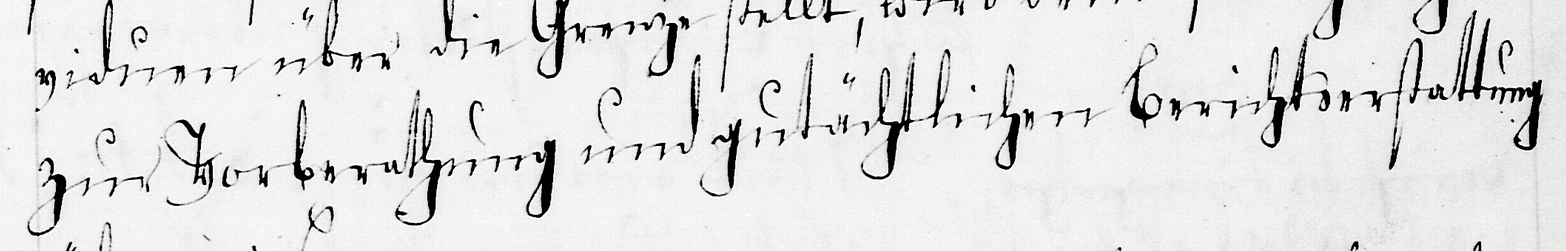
zur Vorberathung und gutächtlichen Berichtserstattu¬
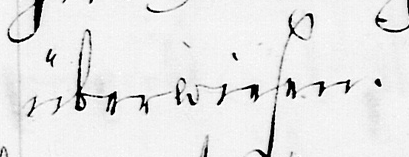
überwiesen.
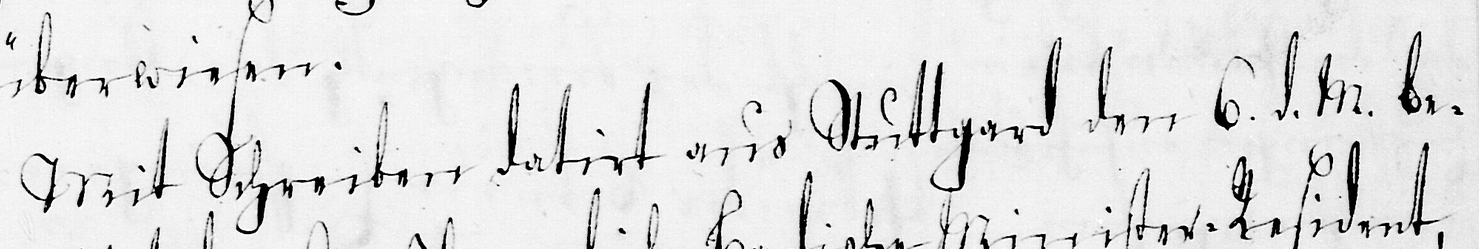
Mit Schreiben datirt aus Stuttgard den 6. d. M. be¬
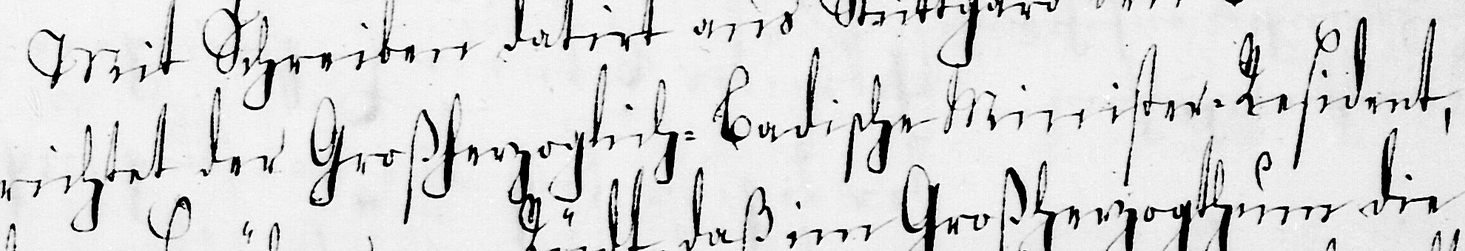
richtet der Großherzoglich-Badische Minister-Resident,
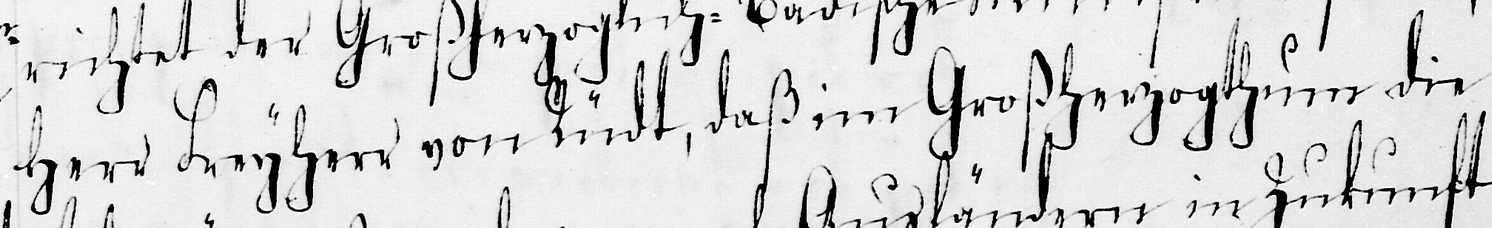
Herr Freyherr von Rüdt, daß im Großherzogthum die
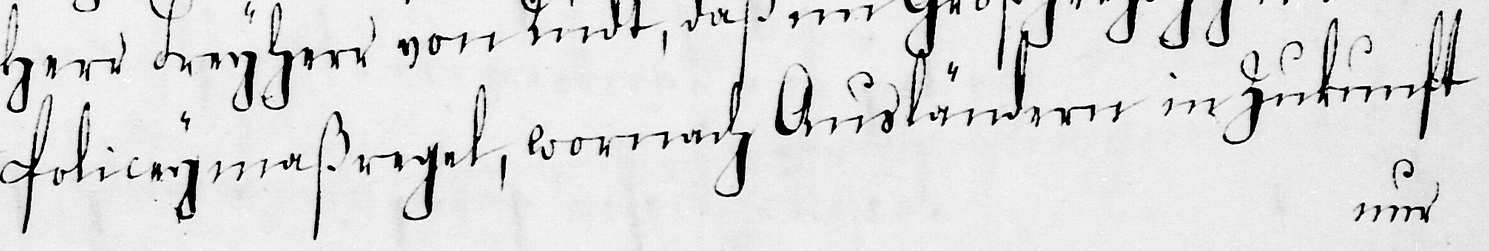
Policeymaßregel, wornach Ausländern in Zukunft
